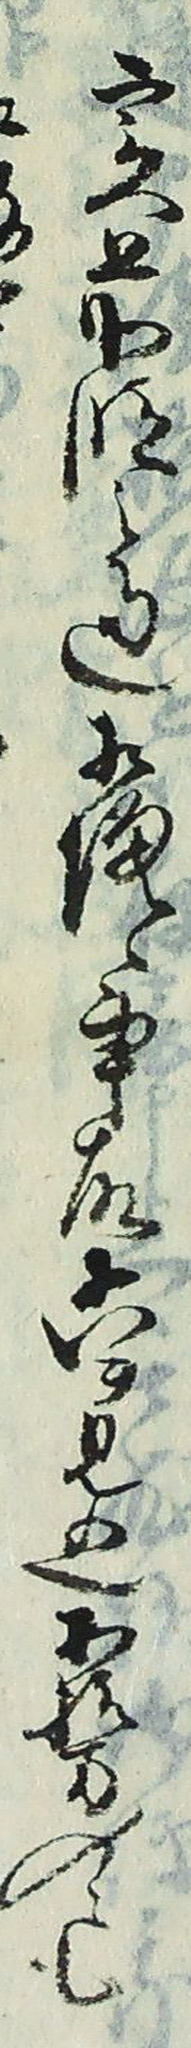実前段之通相増候事故右を見込五拾万〆にも
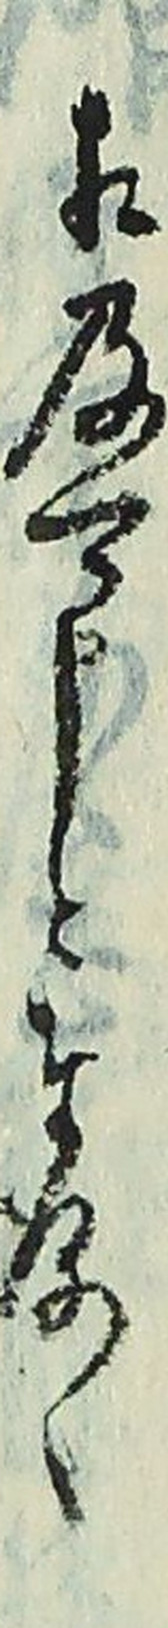相及可申と奉存候
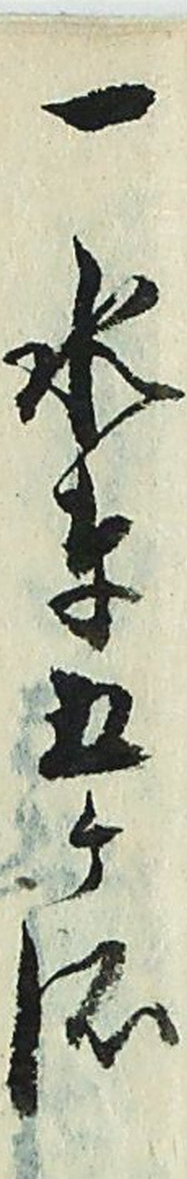一水車五ケ所
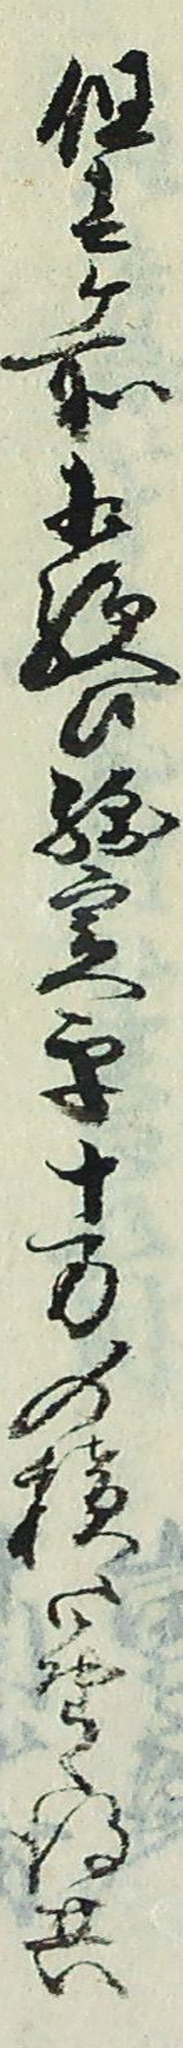但壱ケ所相絞候綿実平十万〆積に御坐候得共
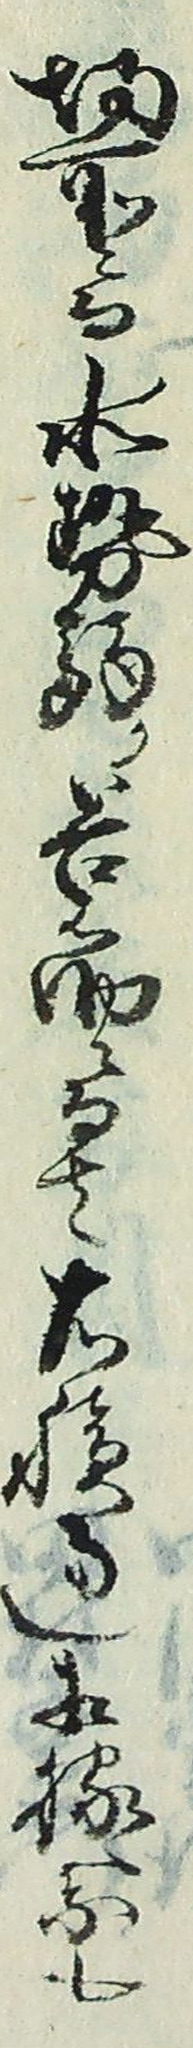場所に而水勢弱り谷筋に而者右積通相稼候義も
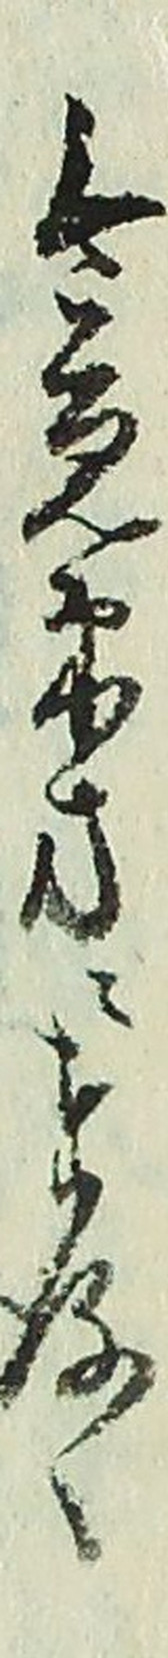無覚束方に奉存候
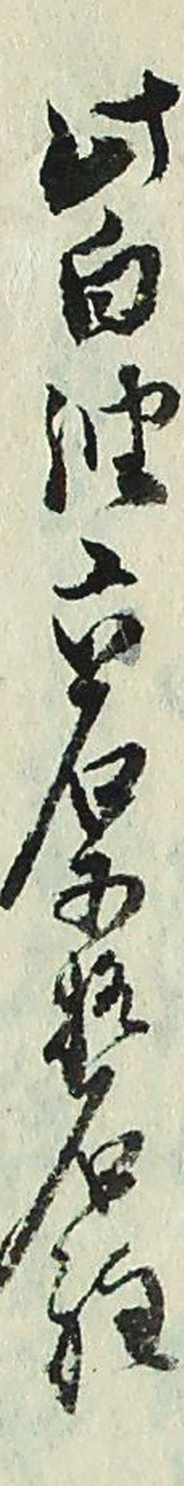此白油六百五拾石程
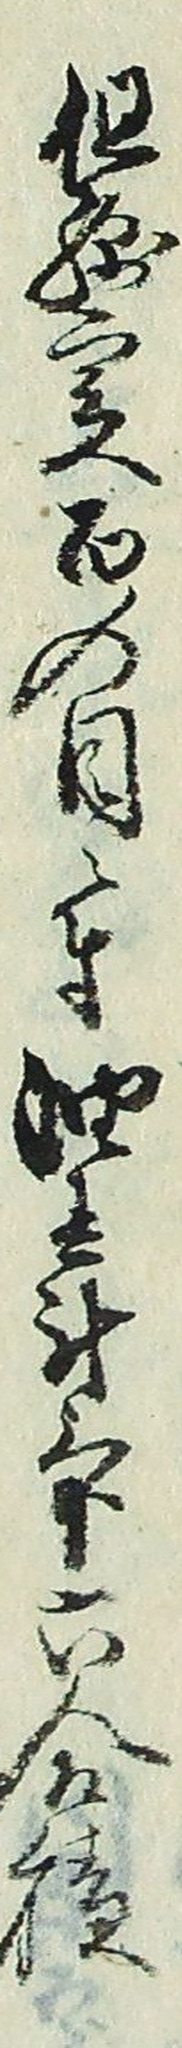但綿実百〆目に付油壱斗三升六合積
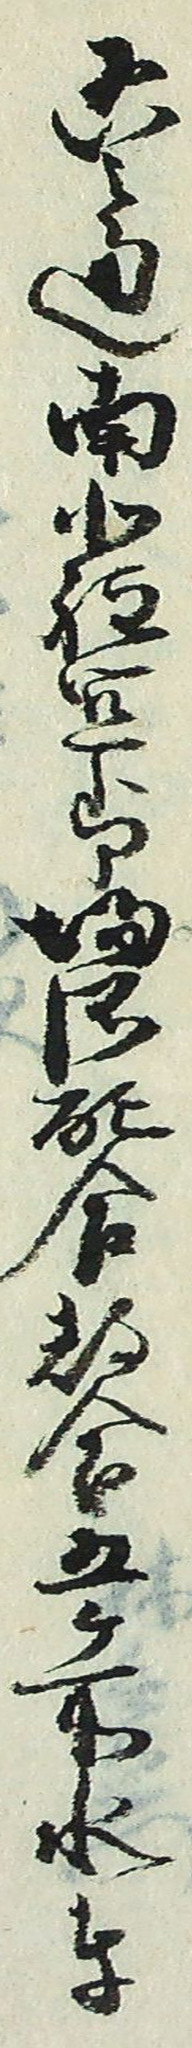右之通南北程宜布場所配合都合五ケ所水車
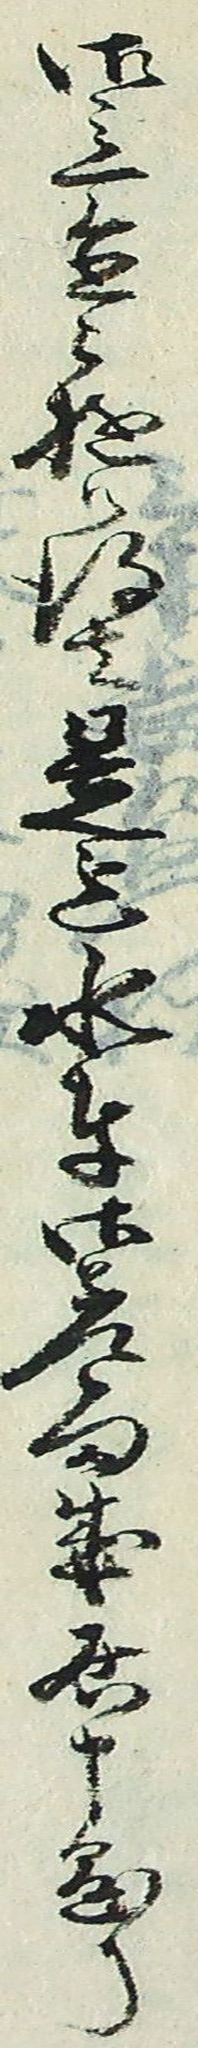御立置被遊得者是迄水車御差留成居申懸り
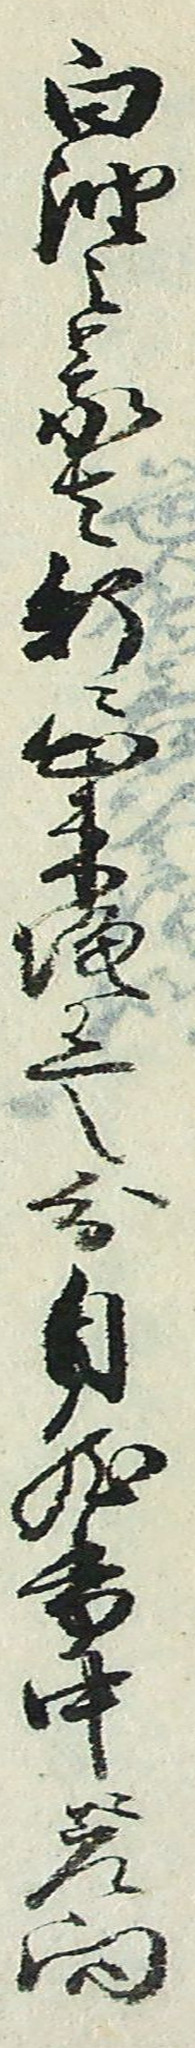白油之義者新に出来増有之分自然市中に差向
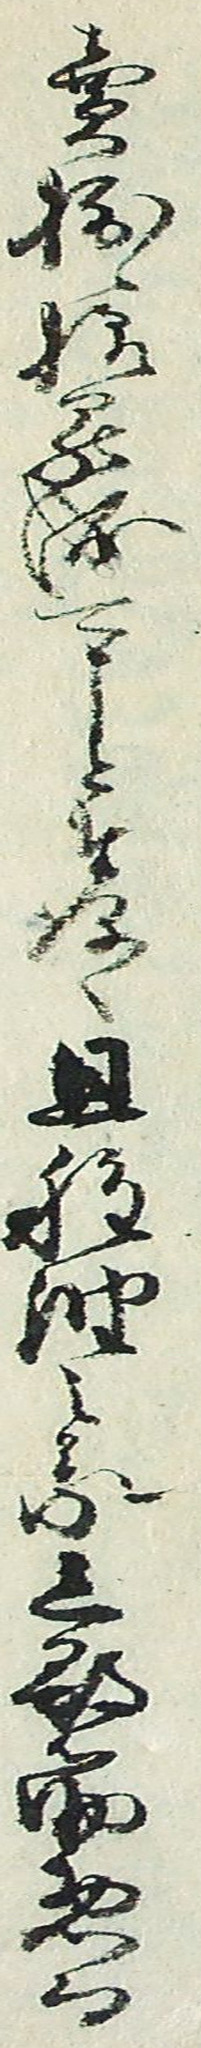売捌候様罷成可申と奉存候且種油之義三郡筋惣而
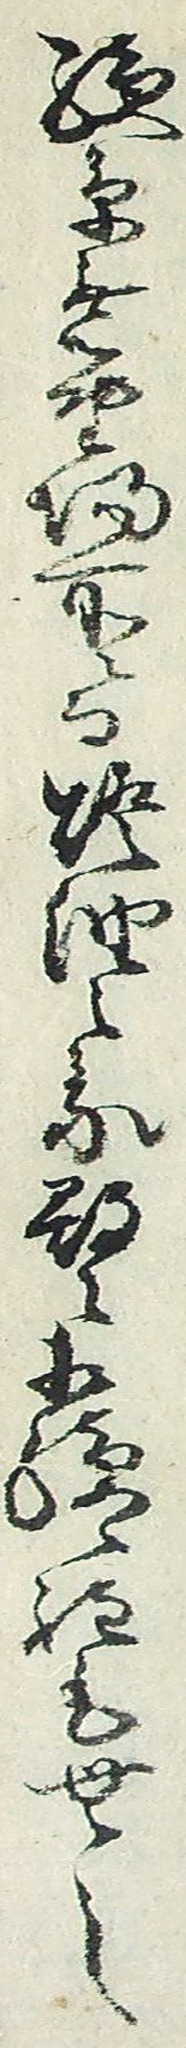絞草無御坐場所に而燈油之義郡々相絞候程も無之

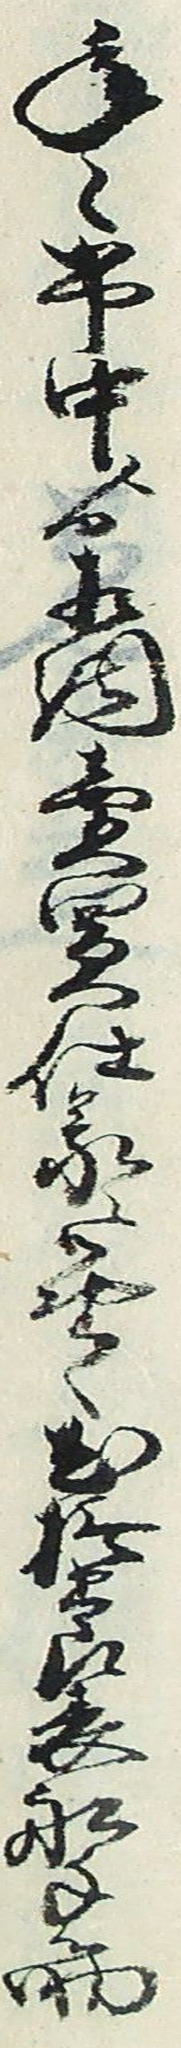年々市中ゟ相調売買仕義に御坐候尤撫養表船手筋
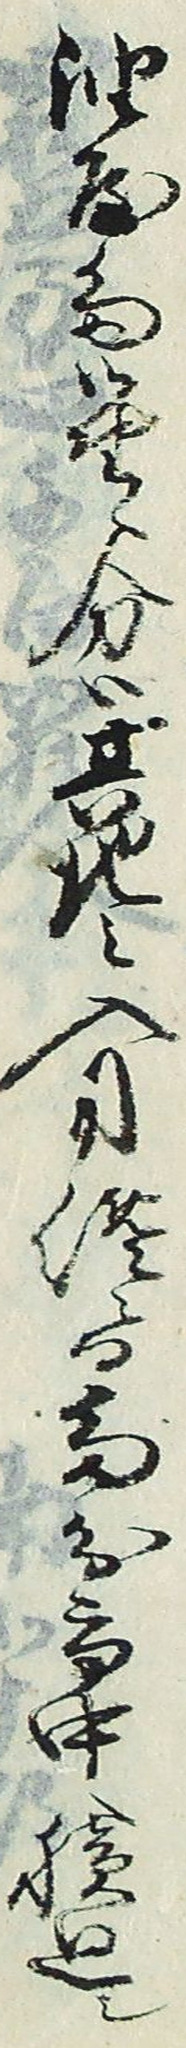油屋多く御坐候分は其地之入用纔にて多分市中へ積廻し
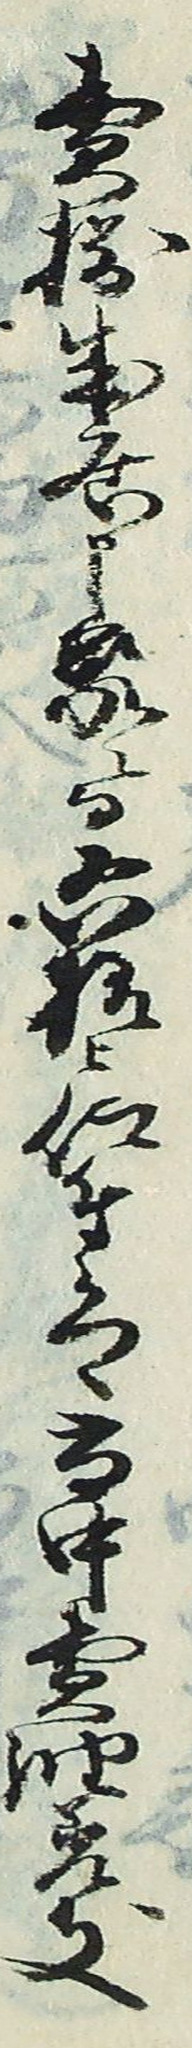売捌成居申義に而右様被仰付候はゝ市中売油差支
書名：油稼御取究ニ附御箇條書テ以被仰渡南北同役申談御答書控
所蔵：鳴門教育大学 Naruto University of Education
